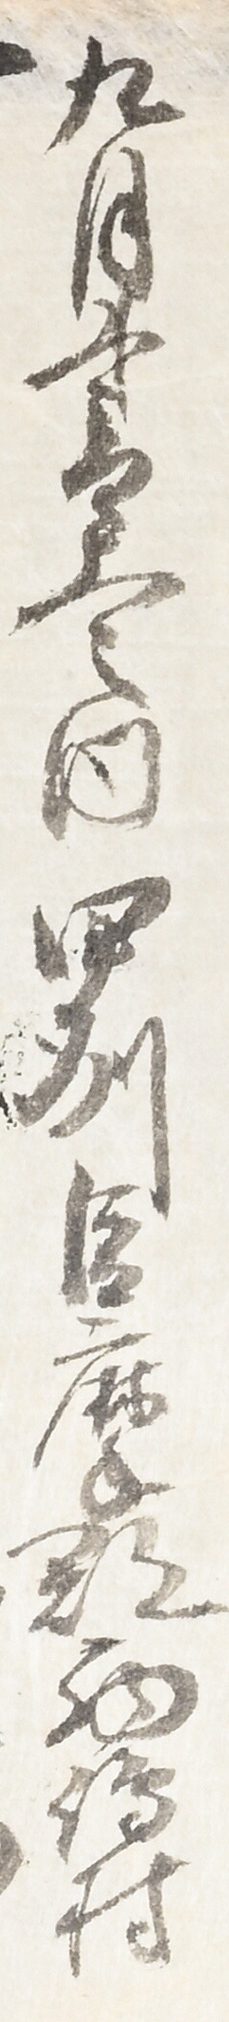九月書上之内甲州巨摩郡西嶋村
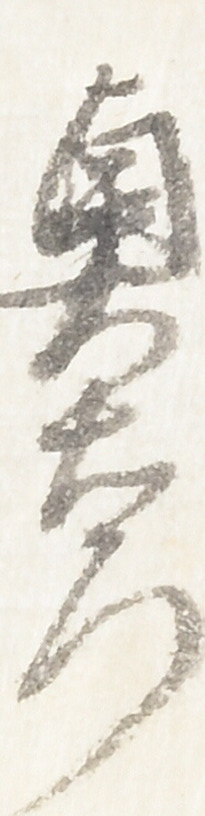奥右衛門
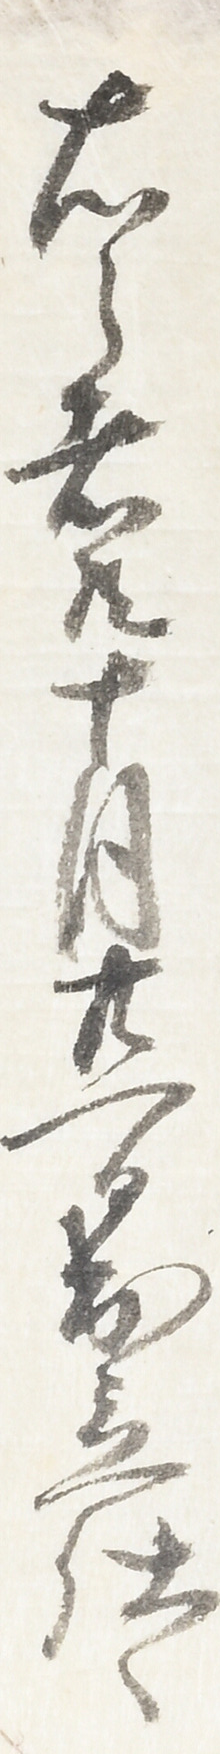右之者共十月廿一日出立仕候
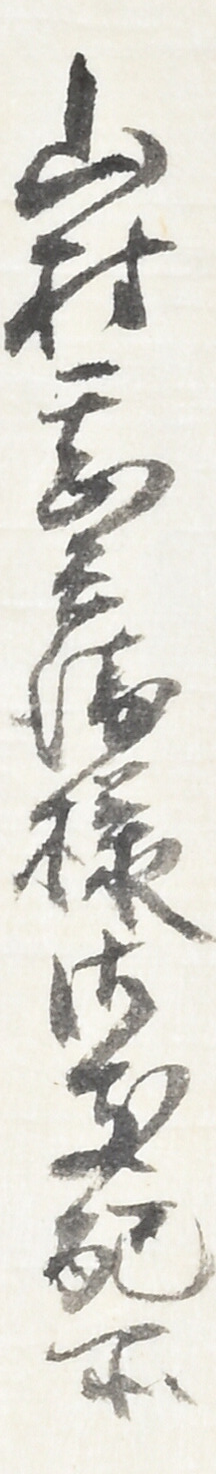山村甚兵衛様御支配所
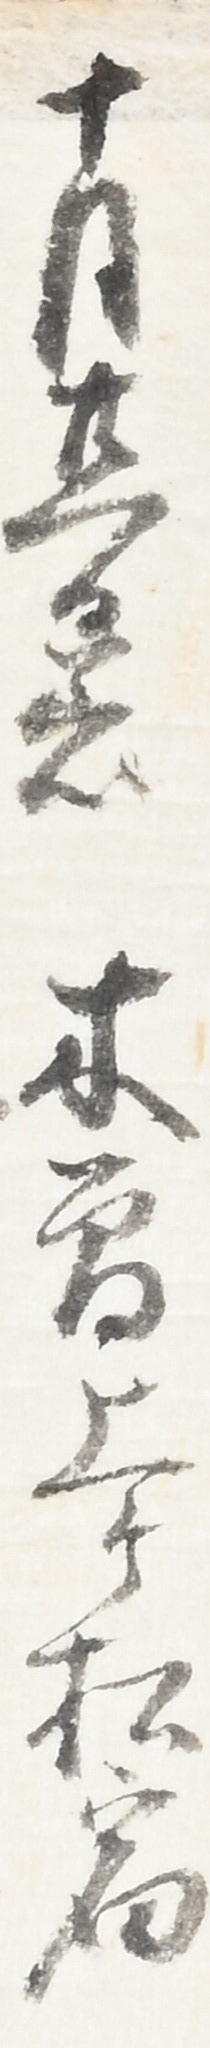十月廿一日着木曽上ゲ松宿
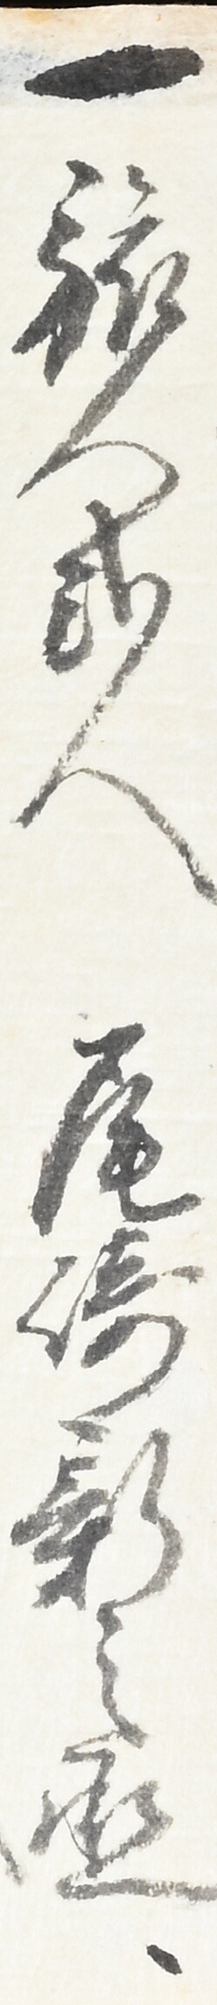一旅人弐人尾崎新之丞・
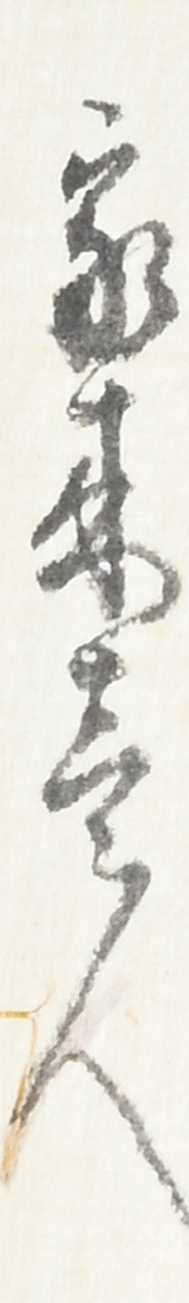家来壱人
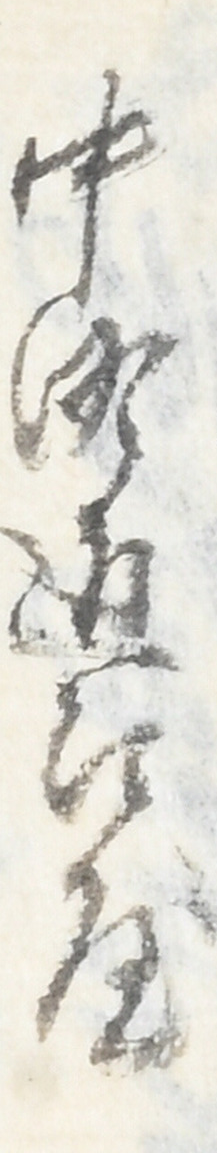中町近江屋
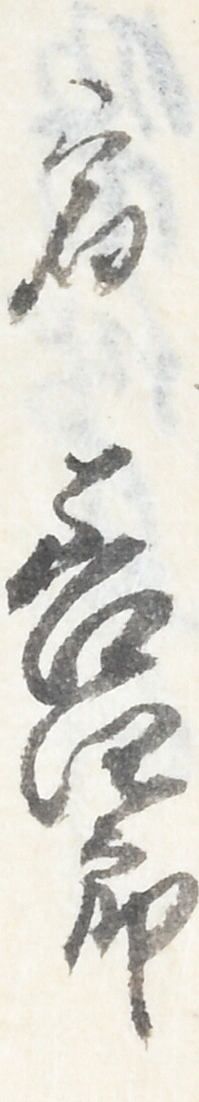宿善四郎
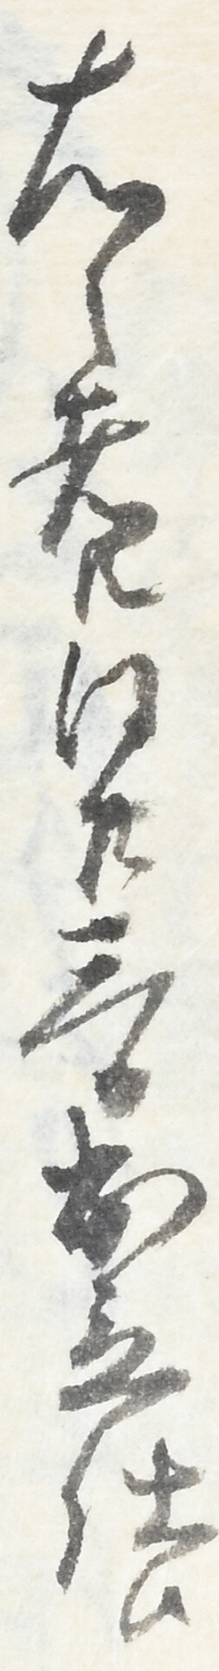右之者同廿一日出立仕候

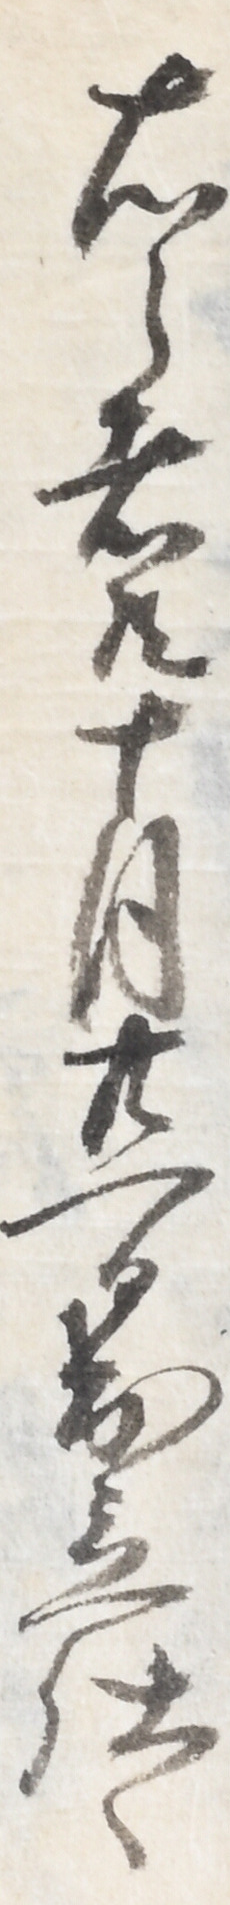右之者共同廿三日出立仕候
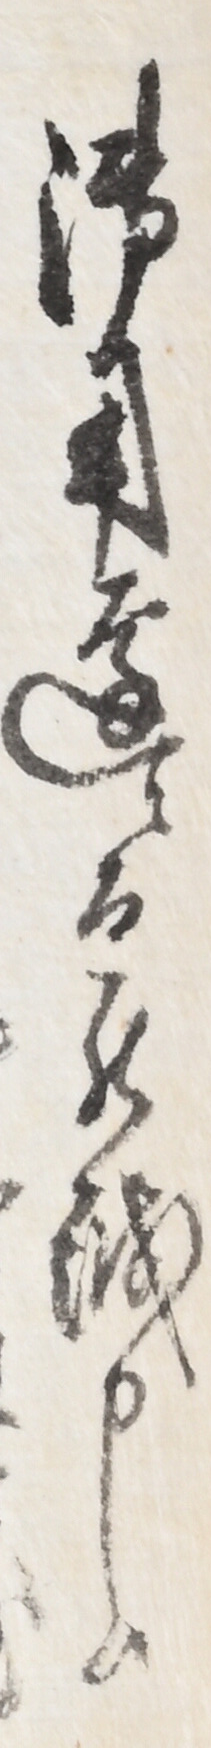御用達ニ而罷越申候
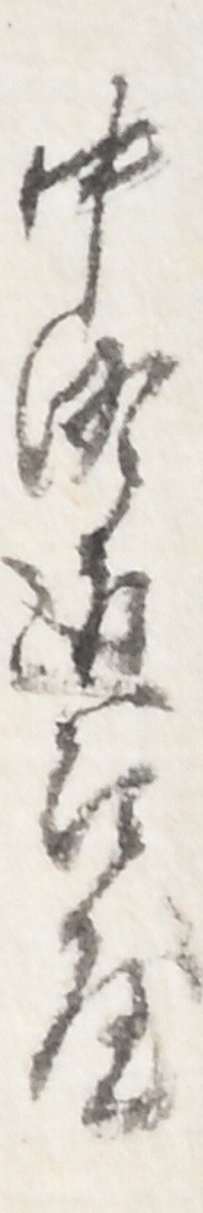中町近江屋
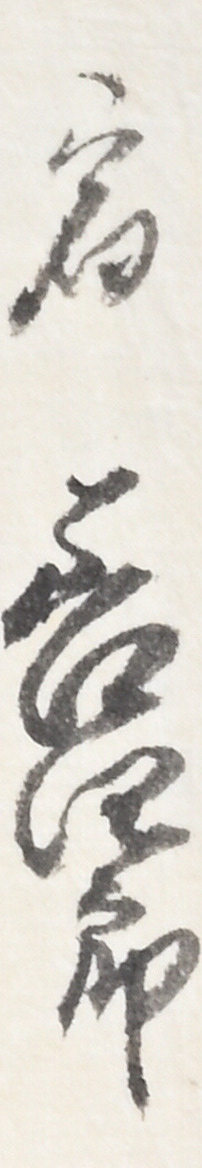宿善四郎
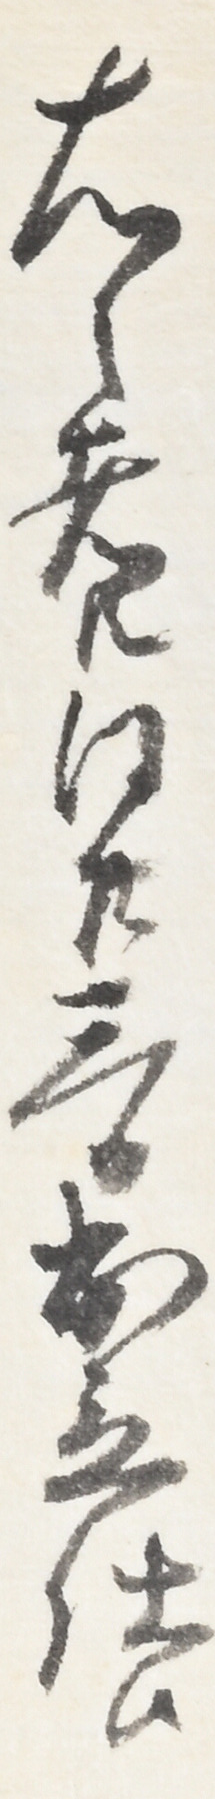右之者共同廿三日出立仕候
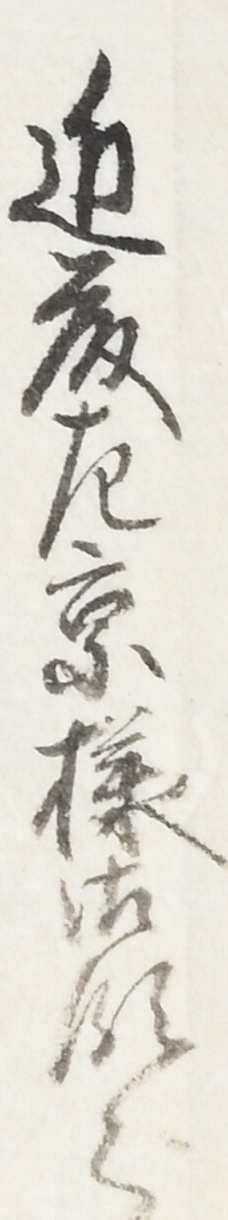近藤左京様御領分
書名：旅人泊控帳
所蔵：伊那市立高遠町図書館・合同会社AMANE
